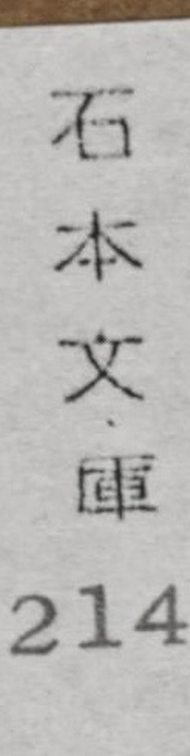石本文庫
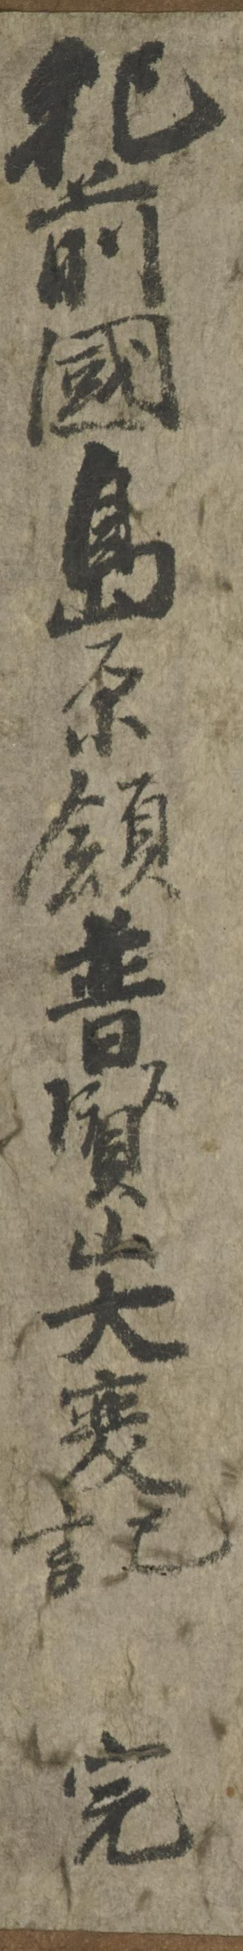肥前国島原領普賢山大変記完

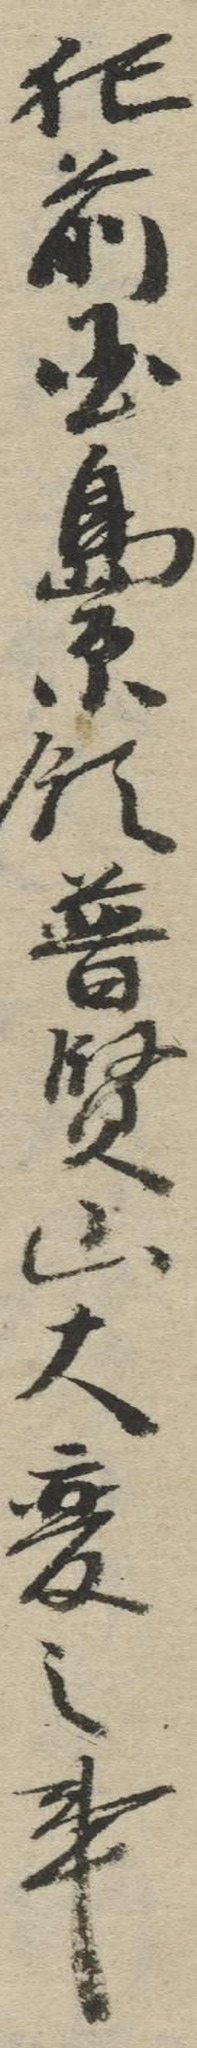肥前国島原領普賢山大変之事
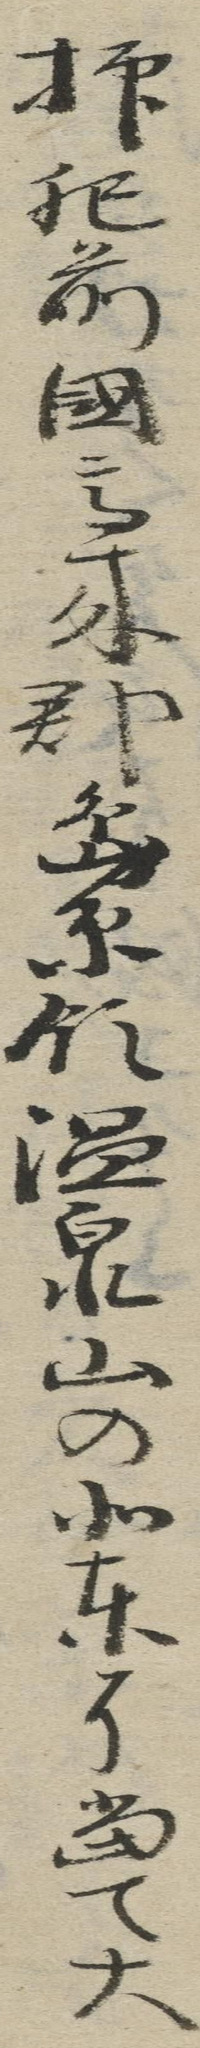抑肥前国高来郡島原領温泉山の北東に当て大
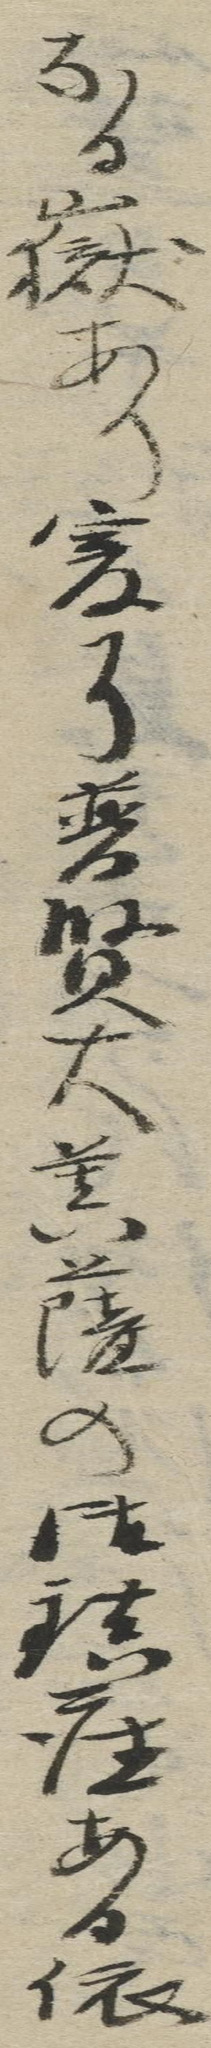なる嶽あり爰に普賢大菩薩の御鎮座ある依
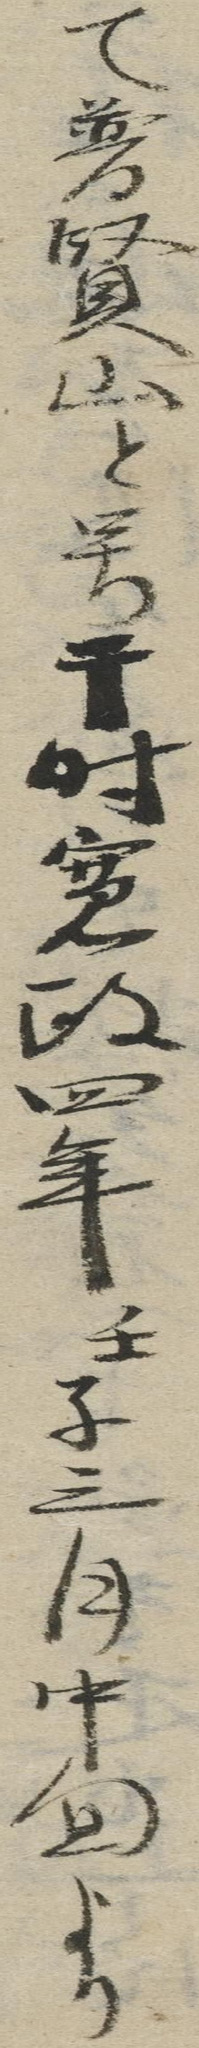て普賢山と号于時寛政四年壬子三月中旬より
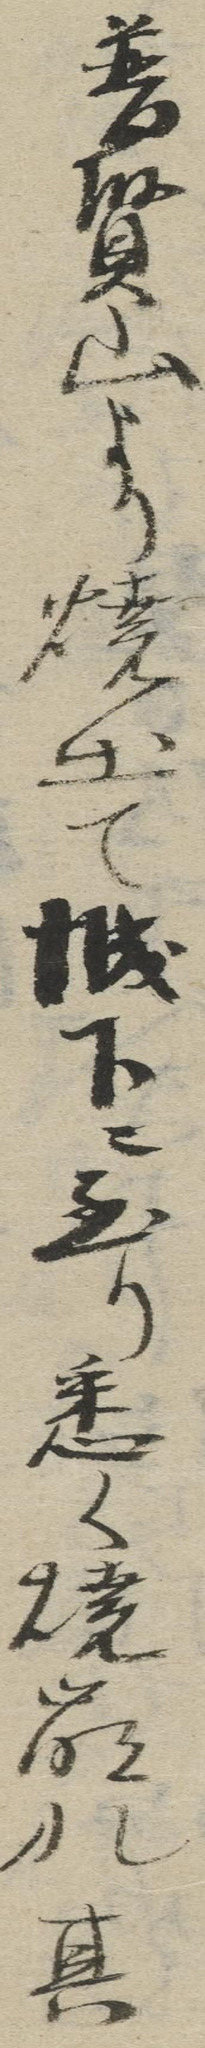普賢山より焼出て城下ニ至り悉く焼崩れ其
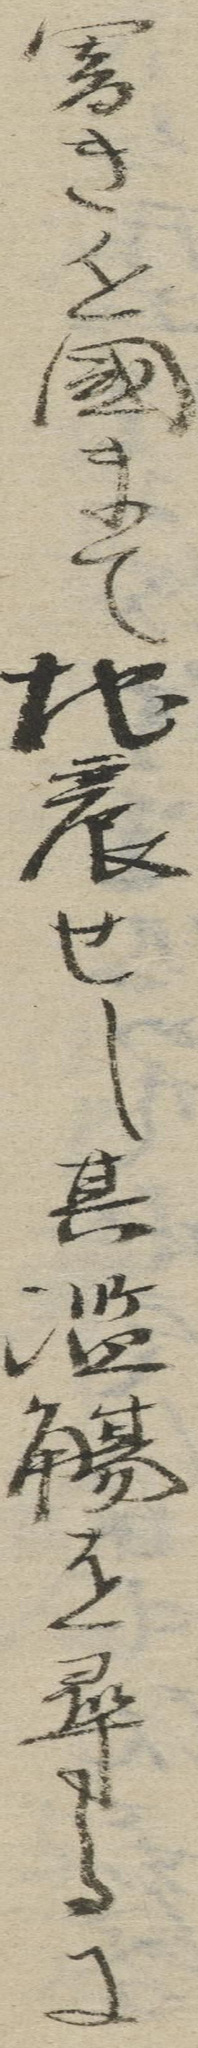響き近国まて地震せし其濫觴を尋ねるに
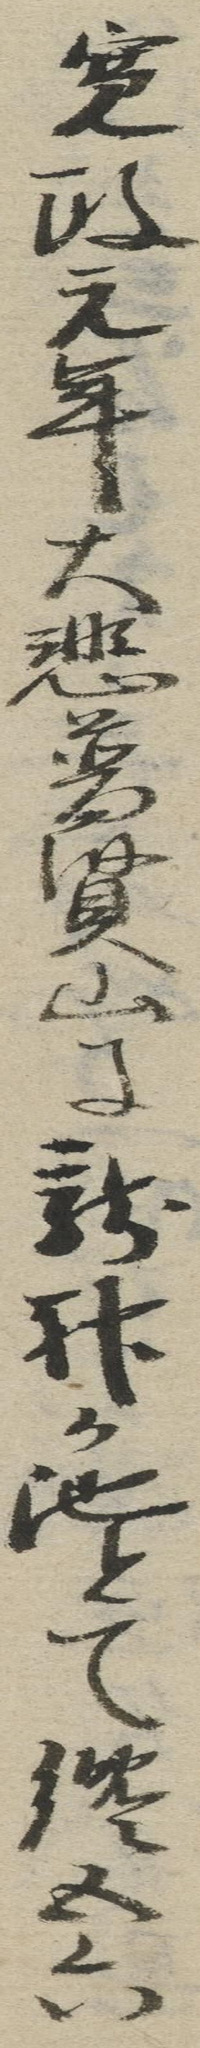寛政元年大悲普賢山に龍神か池とて纔五六
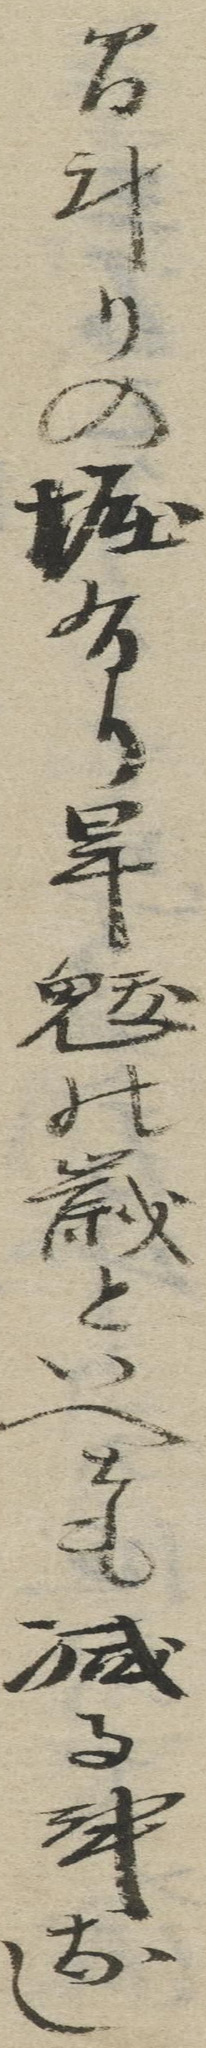間計りの堀有り旱魃の歳といへとも減る事なし
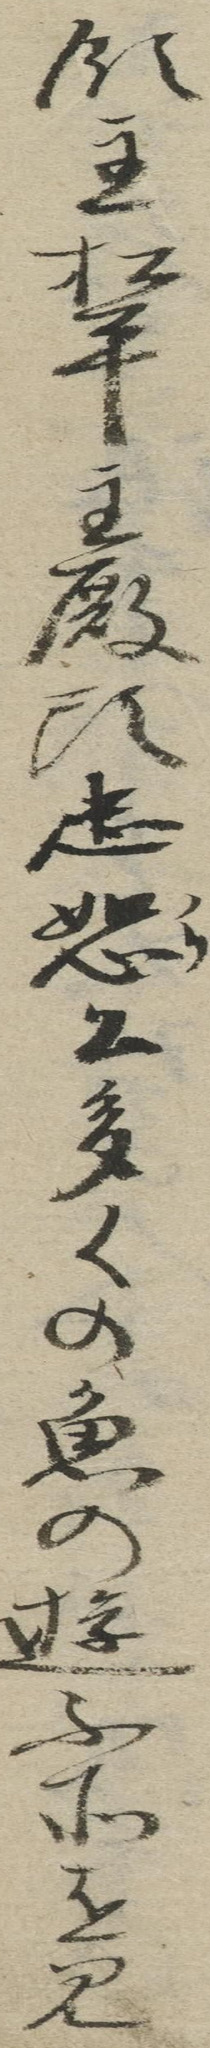領主松平主殿頭忠恕公多くの魚の遊ふ所を見
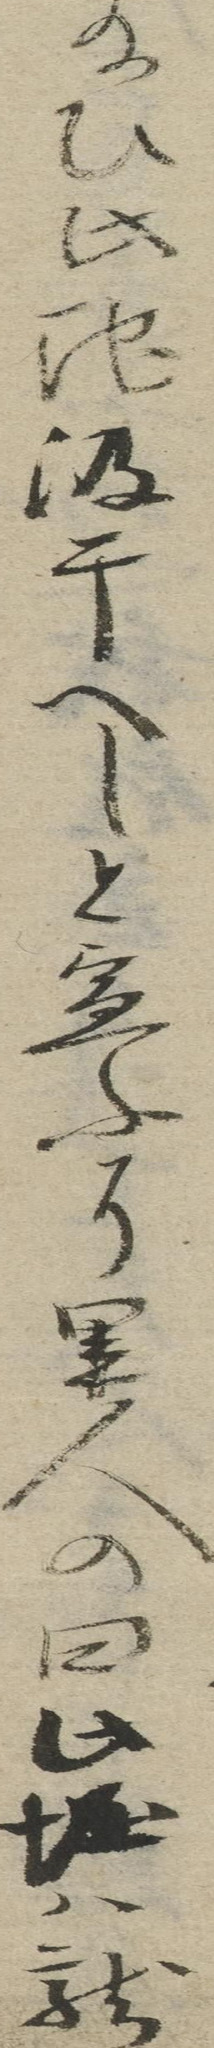給ひ此池汲干へしと宣ふに里人の曰此堀ハ龍
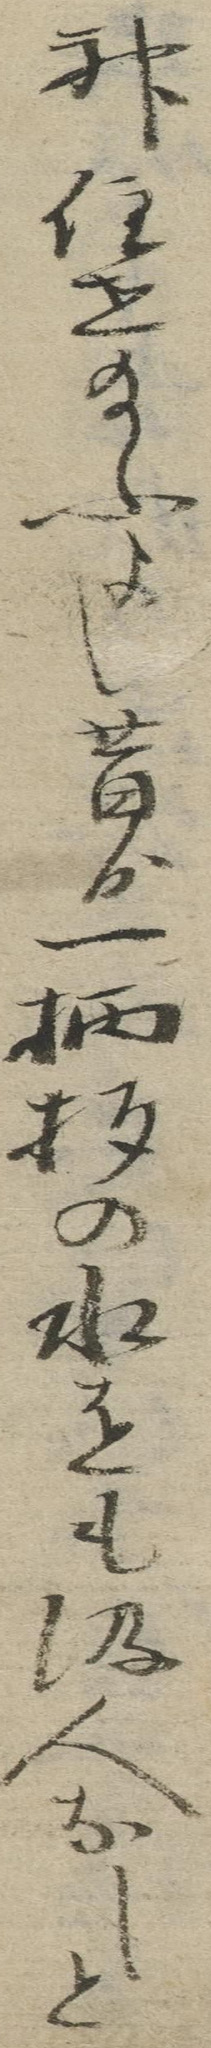神住を給ふよし昔一柄杓の水をも汲人なしと

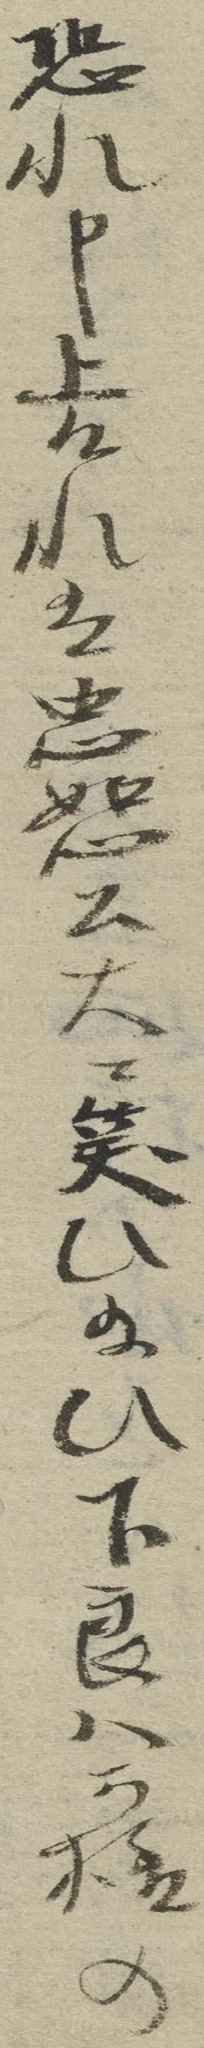恐れ申上けれは忠恕公大ニ笑ひ給ひ下良ハ可様の
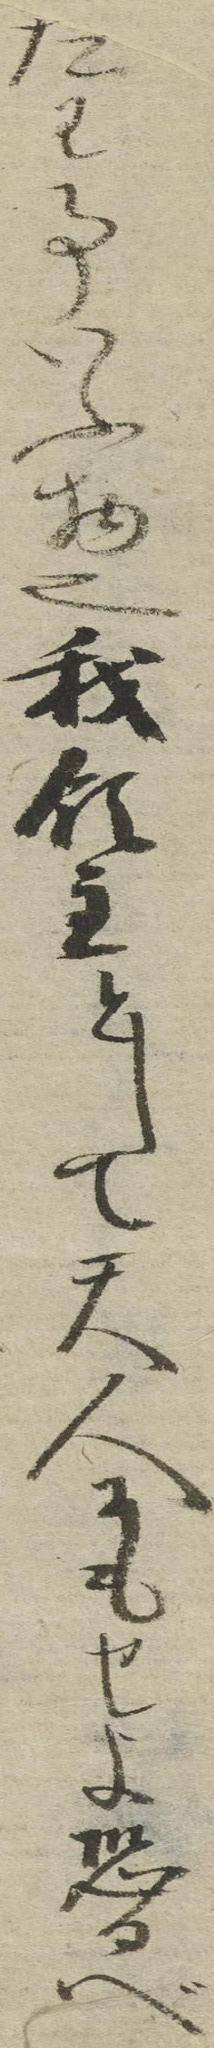たわ事いふ物也我領主として天人にもせよ恐るべ
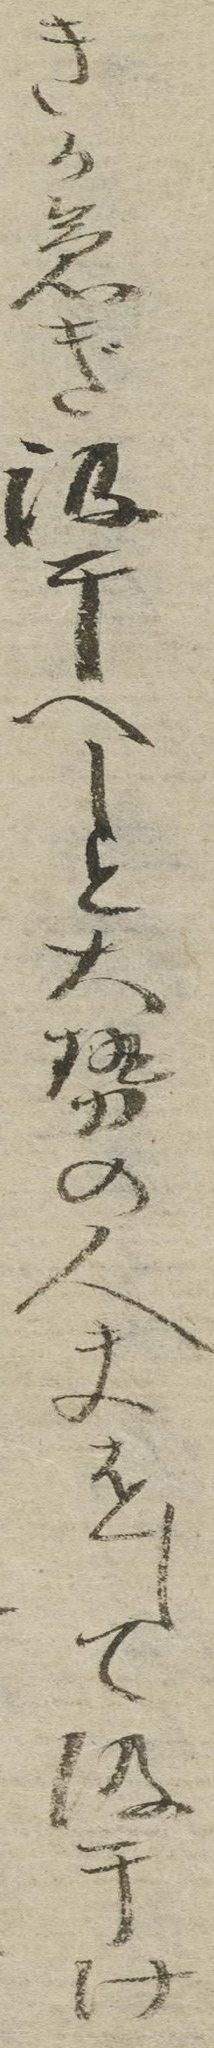きか急ぎ汲干へしと大勢の人夫をして汲干け
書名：肥前國島原領普賢山大変記　完
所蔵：東京大学地震研究所図書室 Earthquake Research Institute Library, The University of Tokyo, JAPAN
